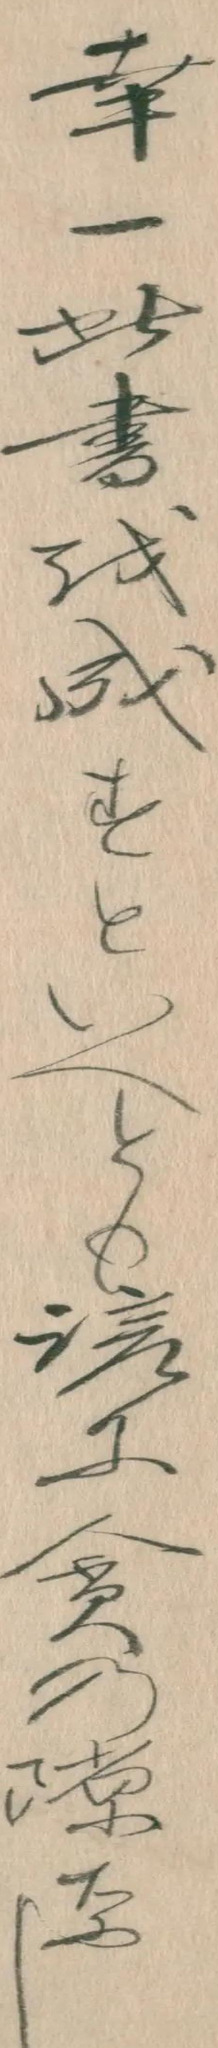幸一此書を成すといへとも諺に貧の隙なし
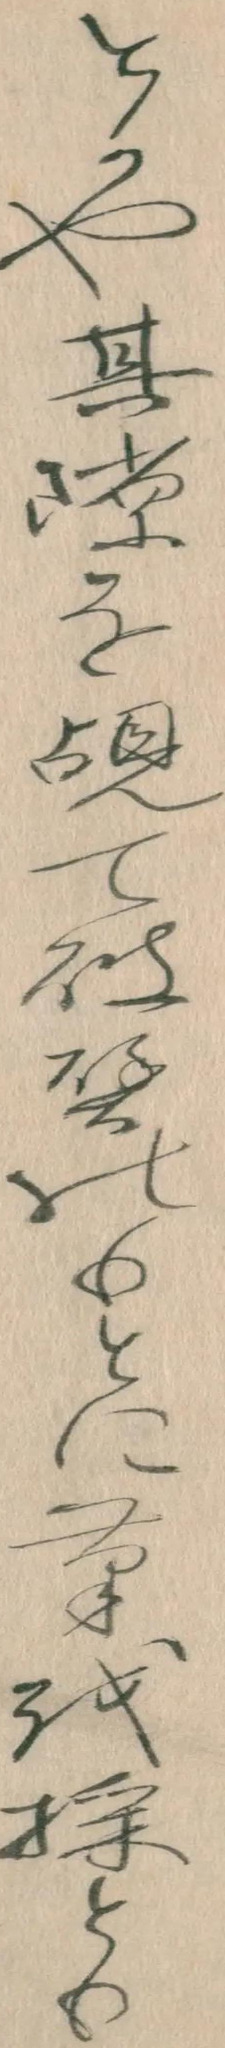とかや其隙を覘て破壁のもとに筆を採とも
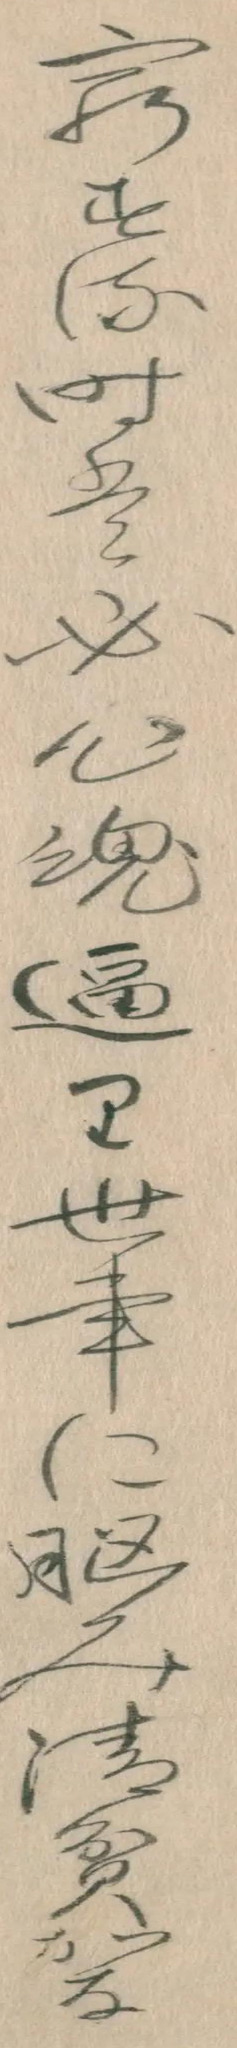窮する時は必心魂逼り世事に脳み清貧かな
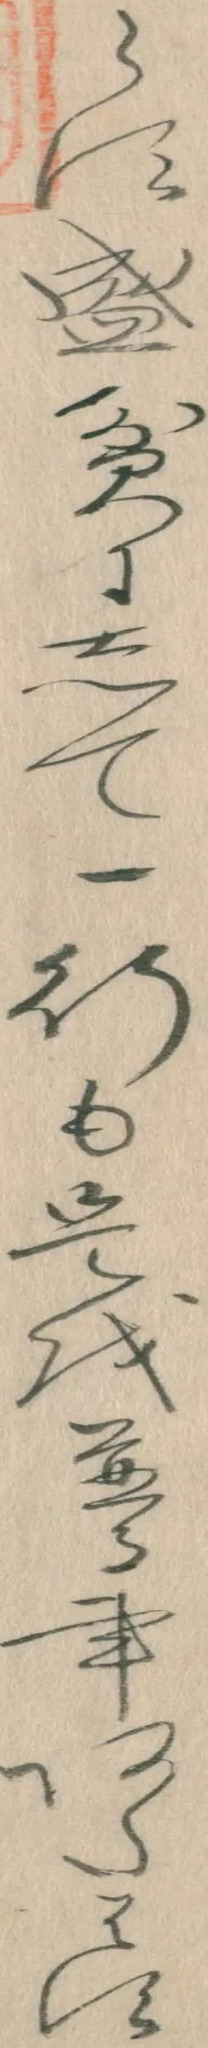らす盛貧にして一行も是を並る事あたはす
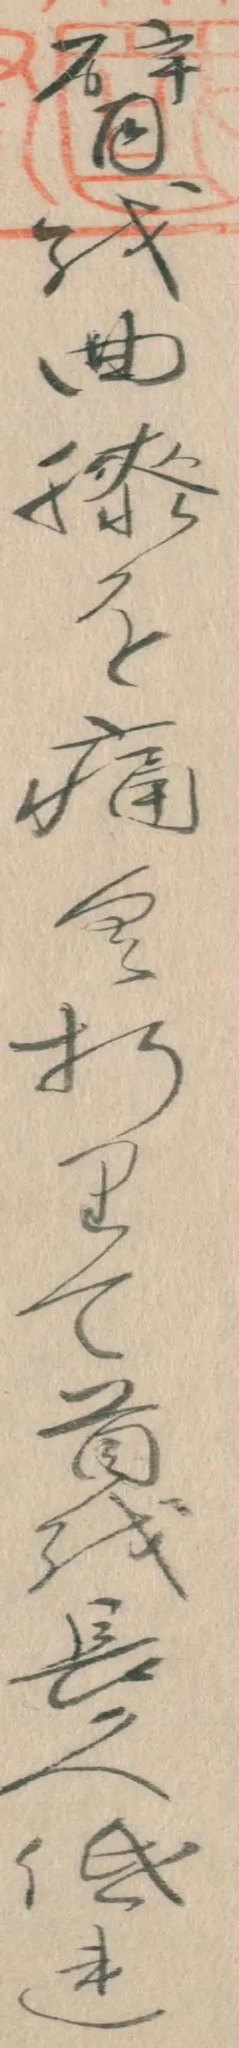臂を曲膝を痛く折りて首を長く低れ
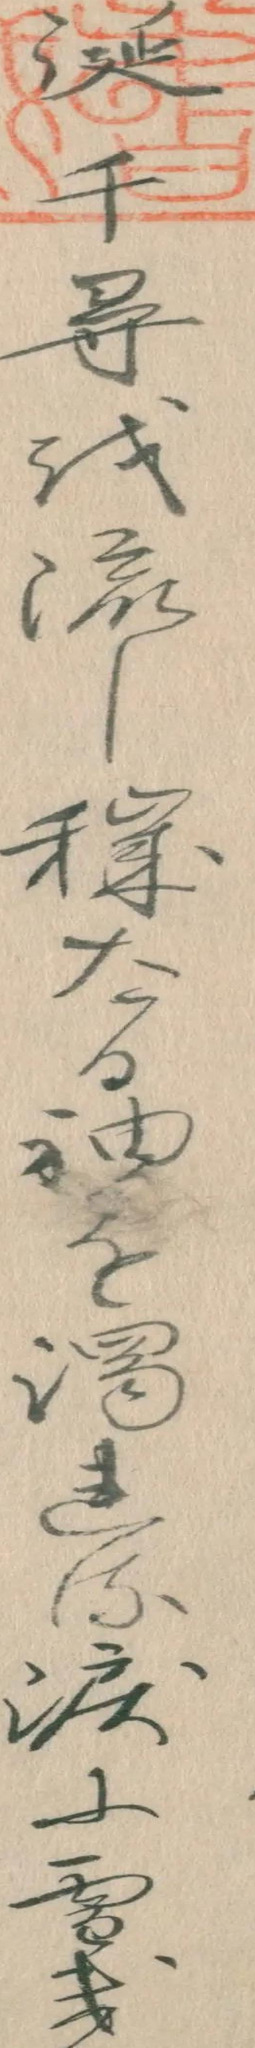涎千尋を流し穢たる袖を濁れる涙に雪き
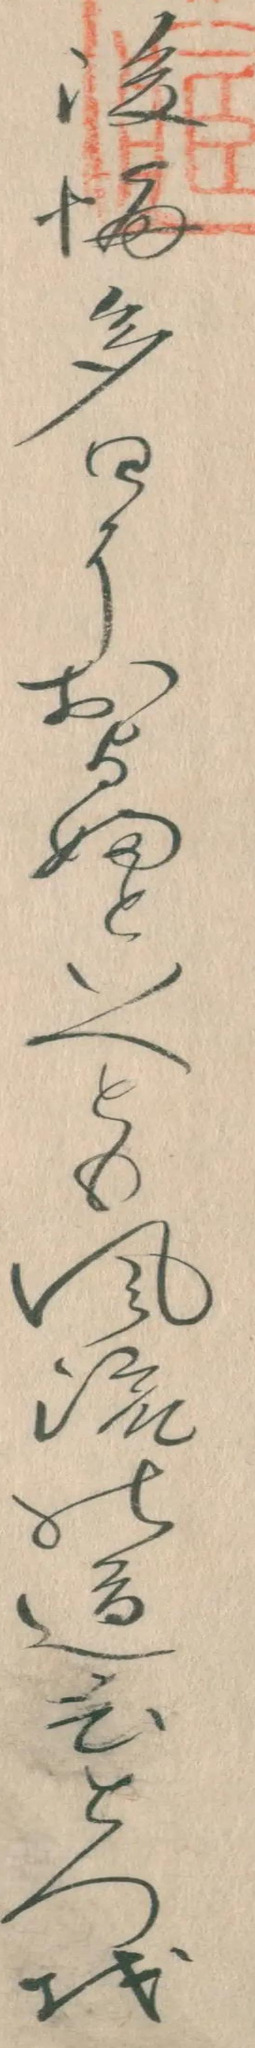後悔多日におよふといへとも風流の道ひとつを
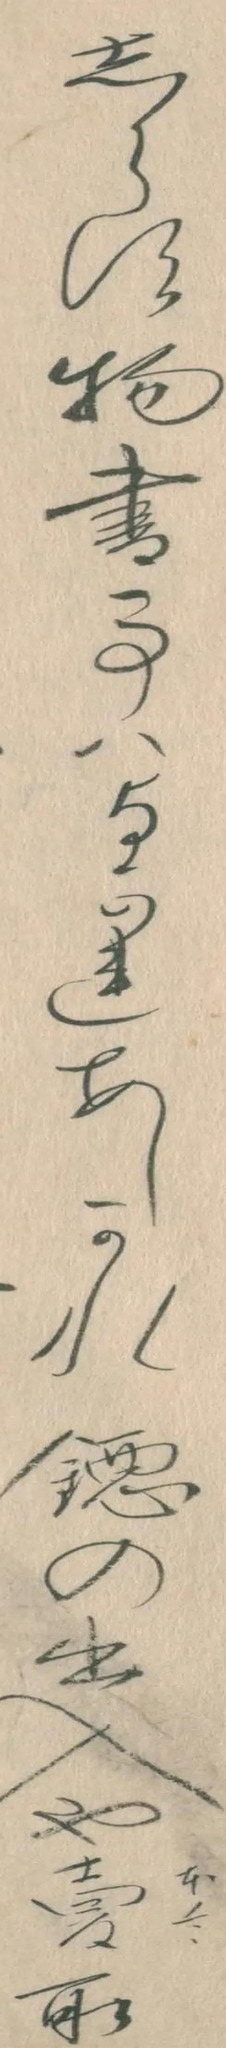しらす物書事はよかれあしかれ鐚の出入や売取
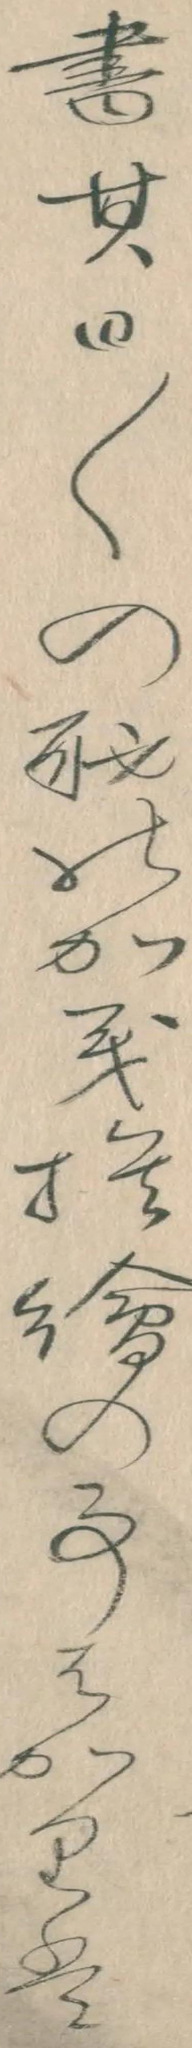書其日〳〵の恥のかき捨絵の事はかりは

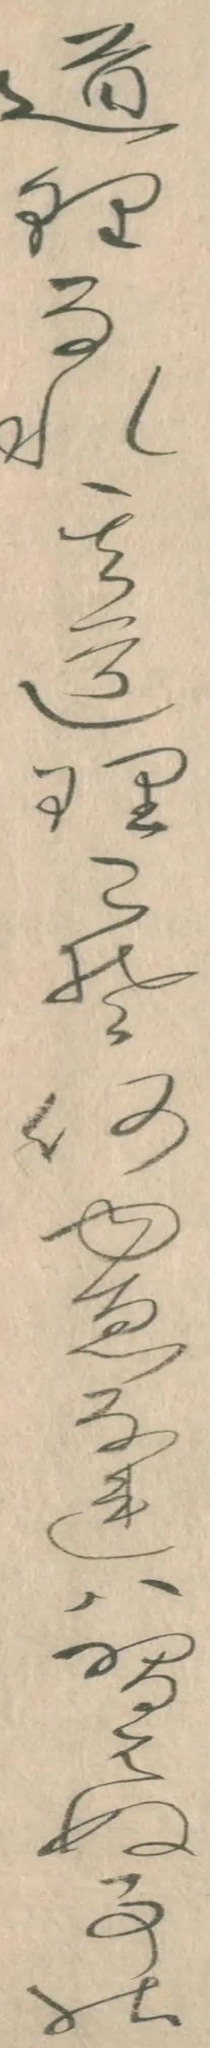道理なれ其道理こそ何ゆゑなれは習はぬ事の
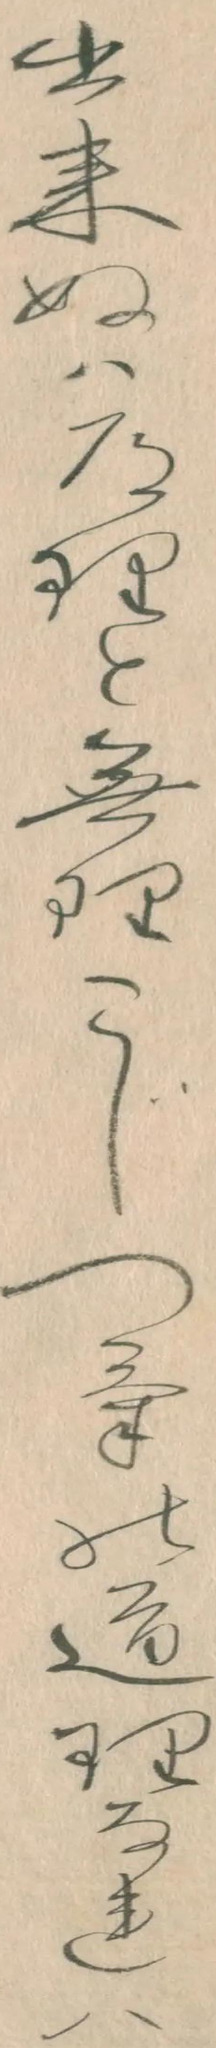出来ぬは道理と無理こじつけの道理なれは
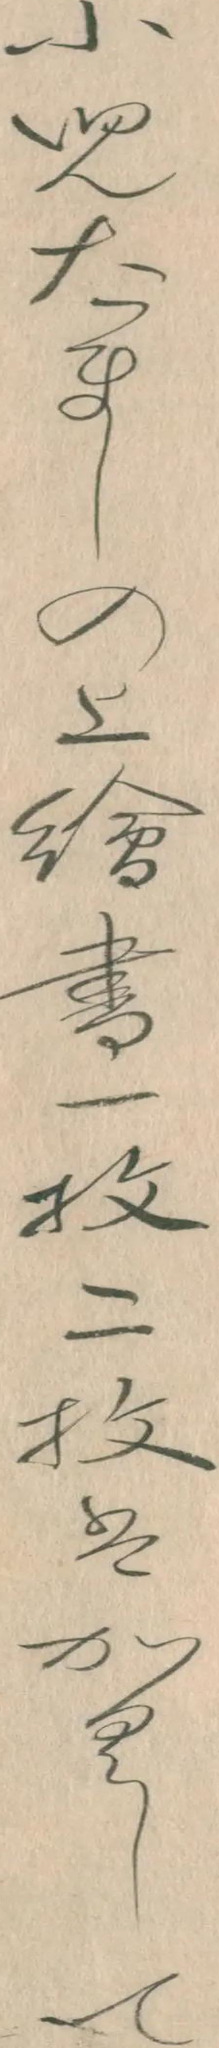小児たましの上絵書一枚二枚はかくして
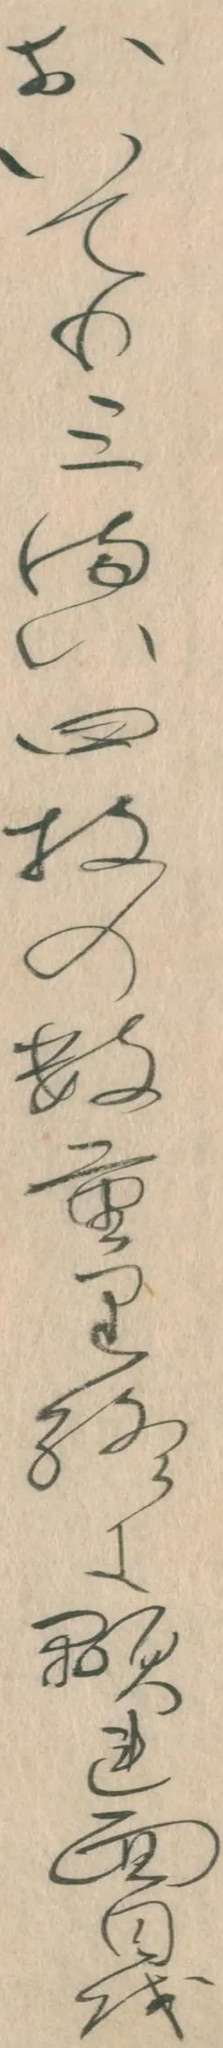おいても三まい四枚の数重り終に顕れ面目を
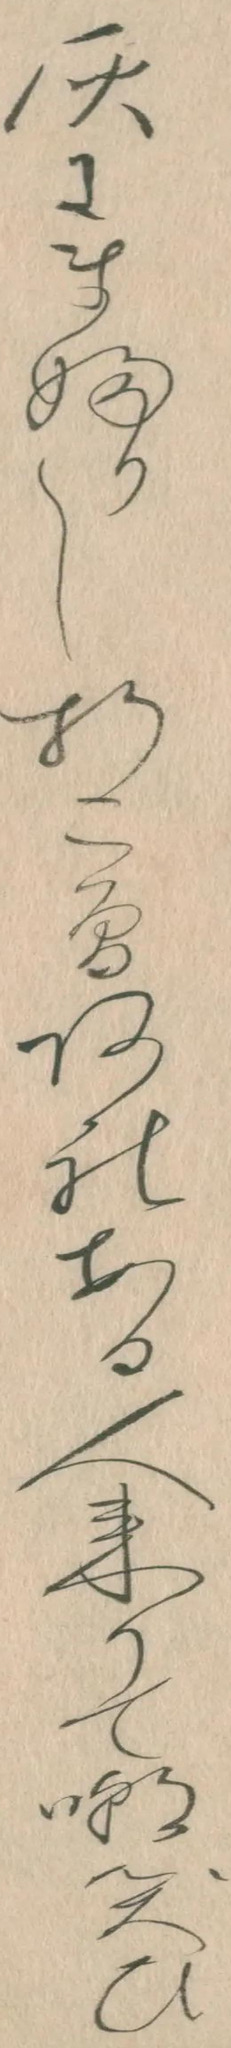灰にまふりし折こそあれある人来りて嘲笑ひ
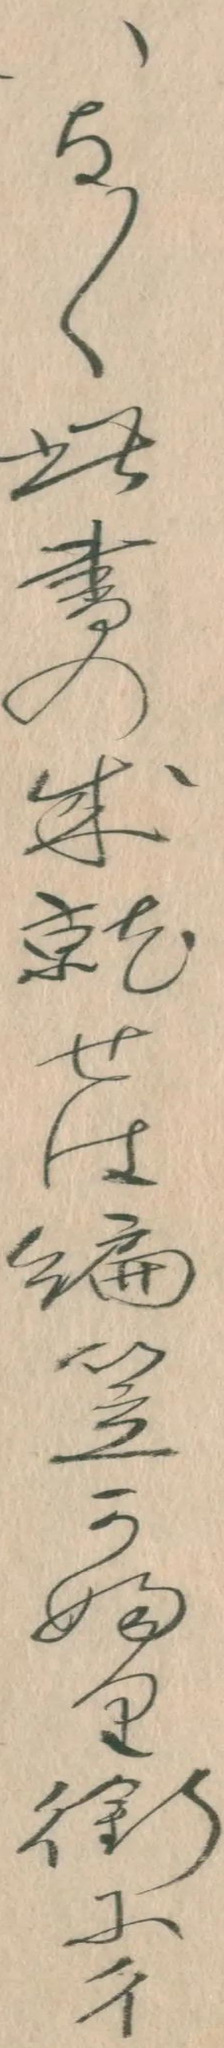いよ〳〵此書の成就せは編笠かふり街に彳
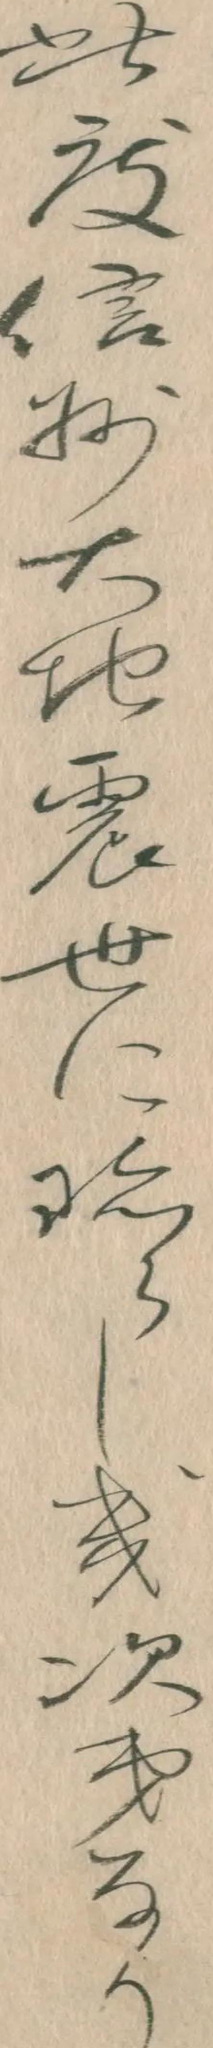此度信州大地震世に珍らしき次第なり
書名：俗語之種. [4]
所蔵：国立国会図書館 National Diet Library, JAPAN
